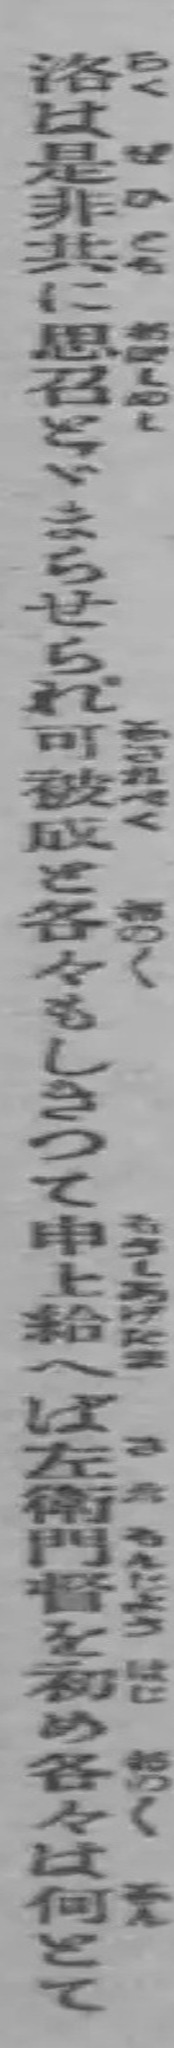洛は是非共に思召とゞまらせられ可被成と各々もしきつて申上給へば左衛門尉を初め各々は何

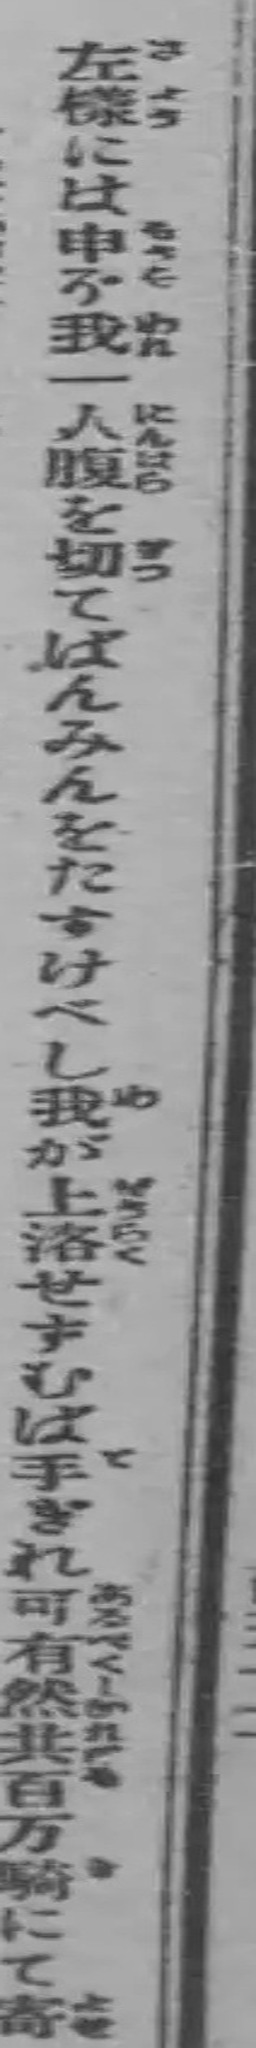左様には申ぞ我一人腹を切てばんみんをたすけべし我が上洛せずむば手ぎれ可有然共百万騎にて寄
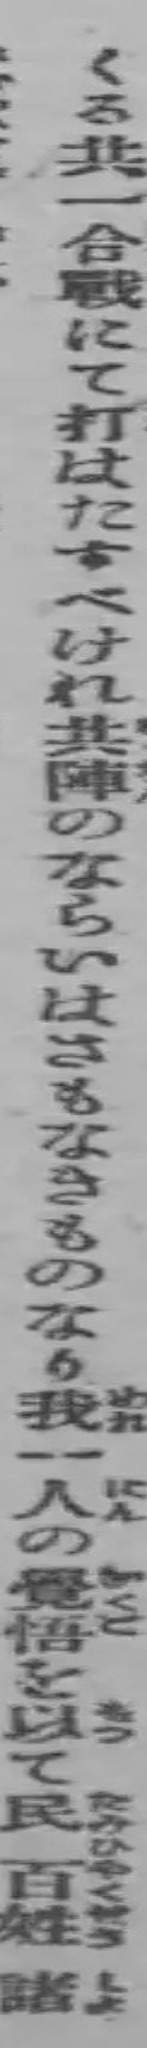くる共一合戦にて打はたすべけれ共陣のならいはさもなきものなり我一人の覚悟を以て民百姓諸
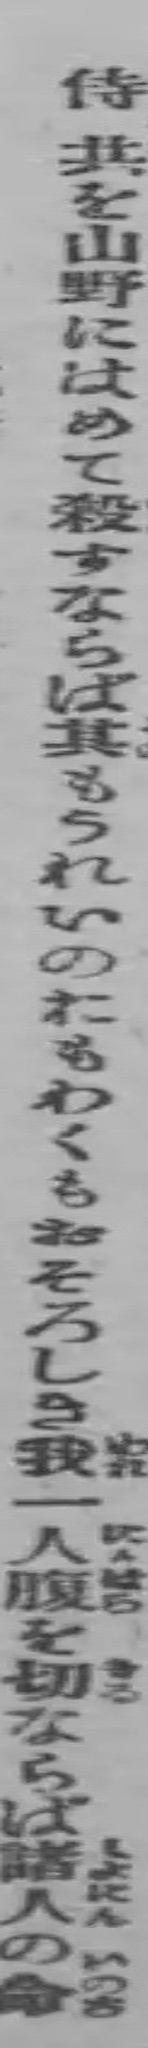侍共を山野にはめて殺すならば其もうれいのおもわくもおそろしき我一人腹を切ならば諸人の命
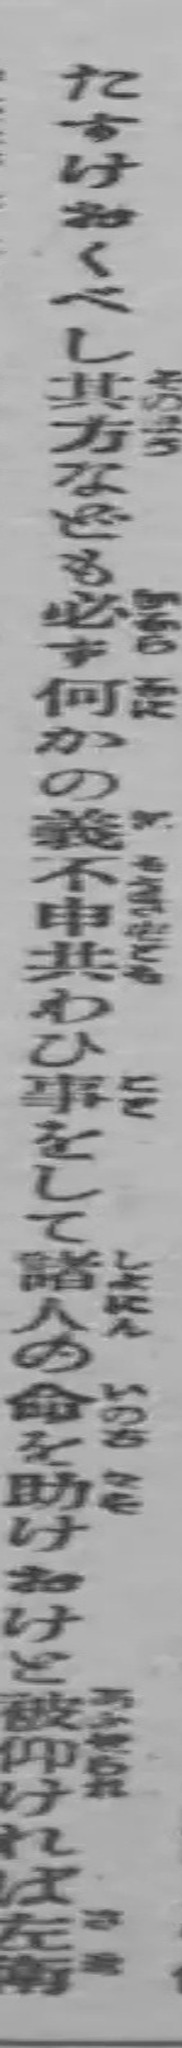たすけおくべし其方なども必ず何かの義不申共わひ事をして諸人の命を助けおけと被仰ければ左衛
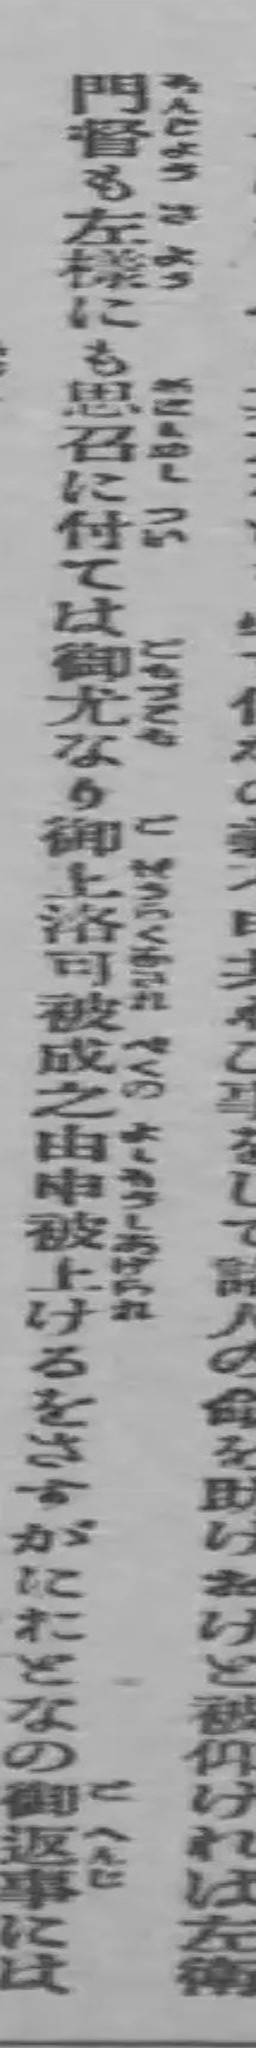門尉も左様にも思召に付ては御尤なり御上洛可被成之由申被上けるをさすがにおとなの御返事には
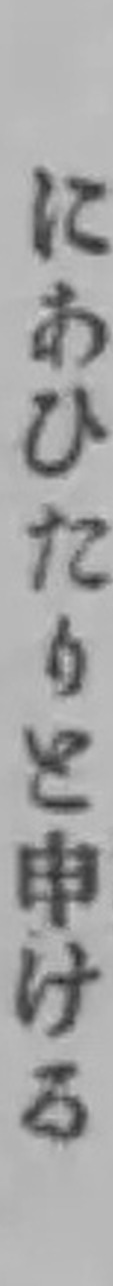にあひたりと申ける
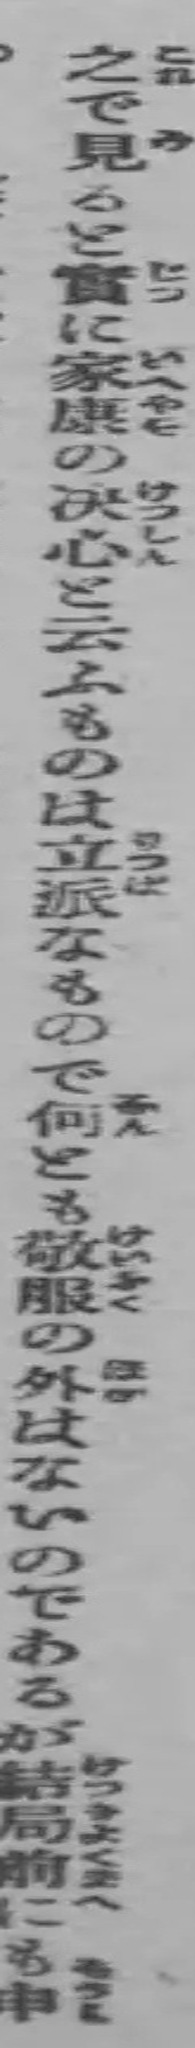家康の決心之で見ると実に家康の決心と云ふものは立派なもので何とも敬服の外はないのであるが結局前にも申
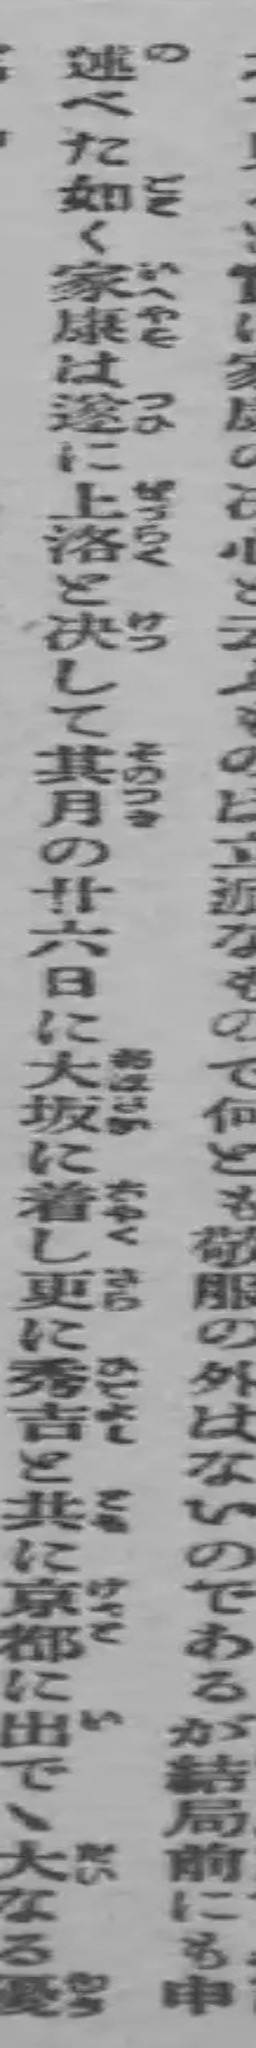述べた如く家康は遂に上洛と決して其月の廿六日に大坂に着し更に秀吉と共に京都に出でゝ大なる優
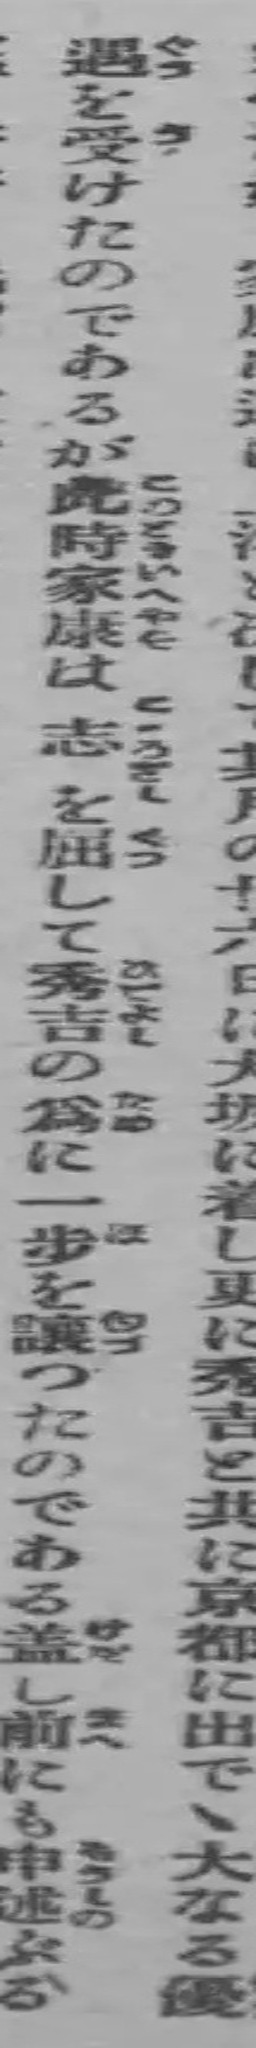遇を受けたのであるが此時家康は志を屈して秀吉の為に一歩を譲つたのである蓋し前にも申述ぶる
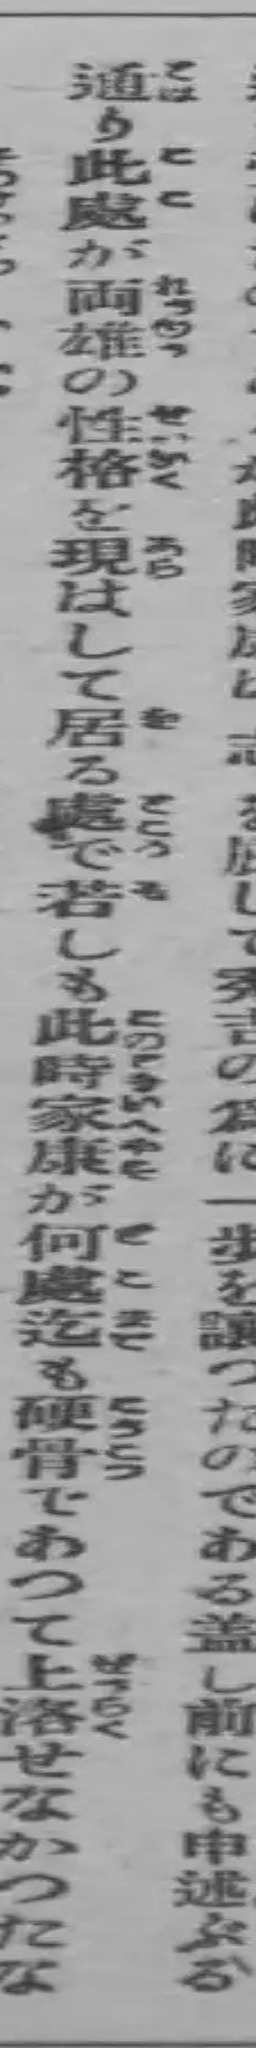通り此処が両雄の性格を現はして居る処で若しも此時家康が何処迄も硬骨であつて上洛せなかつたな
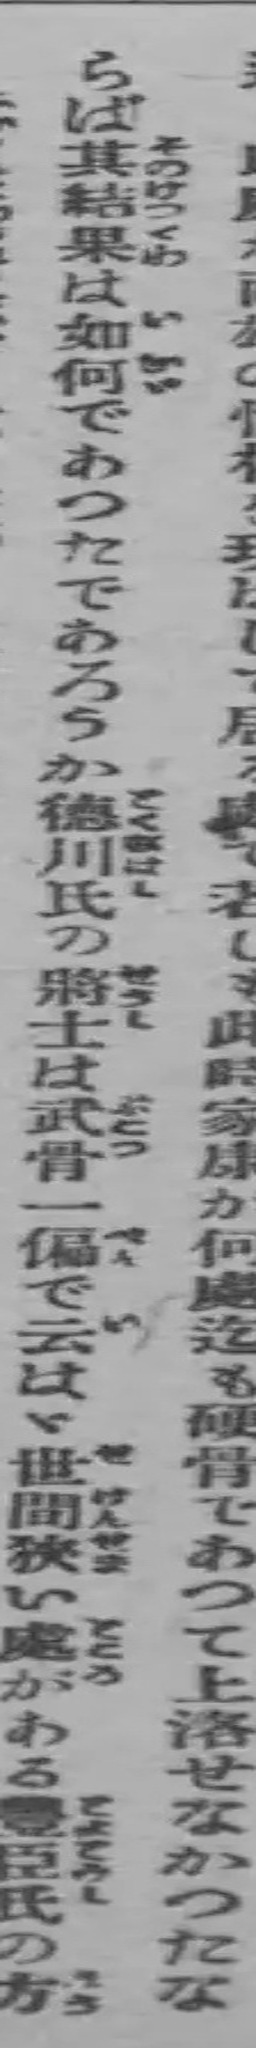らば其結果は如何であつたであろうか徳川氏の将士は武骨一偏で云はゞ世間狭い処がある豊臣氏の方
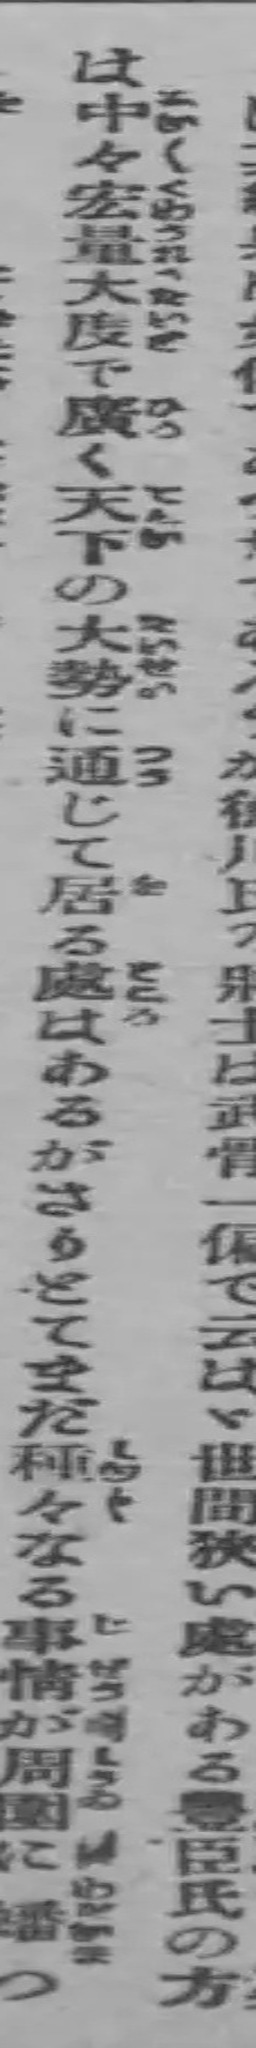は中々宏量大度で広く天下の大勢に通じて居る処はあるがさりとてまだ種々なる事情が周囲に蟠つ
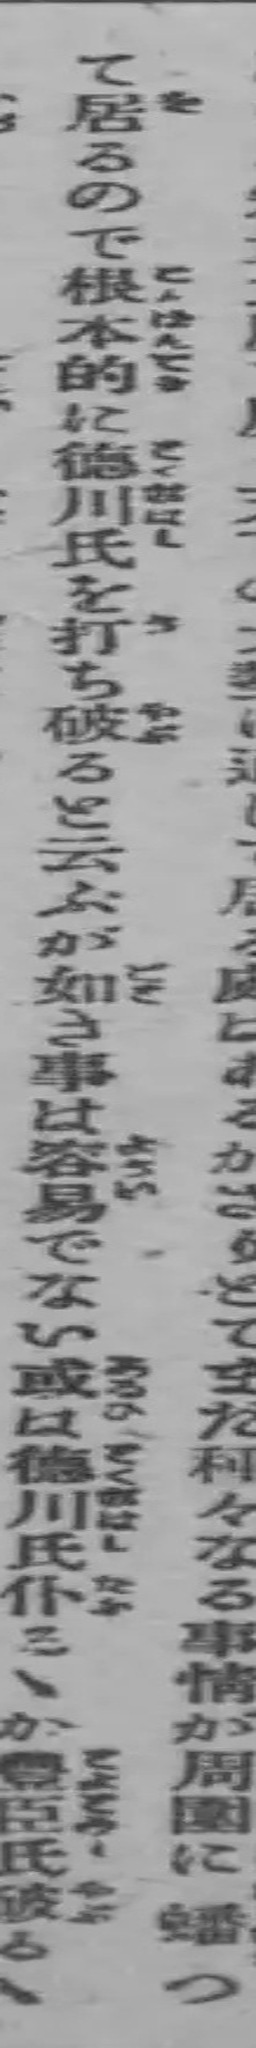て居るので根本的に徳川氏を打ち破ると云ふが如き事は容易でない或は徳川氏仆るゝか豊臣氏破るゝ
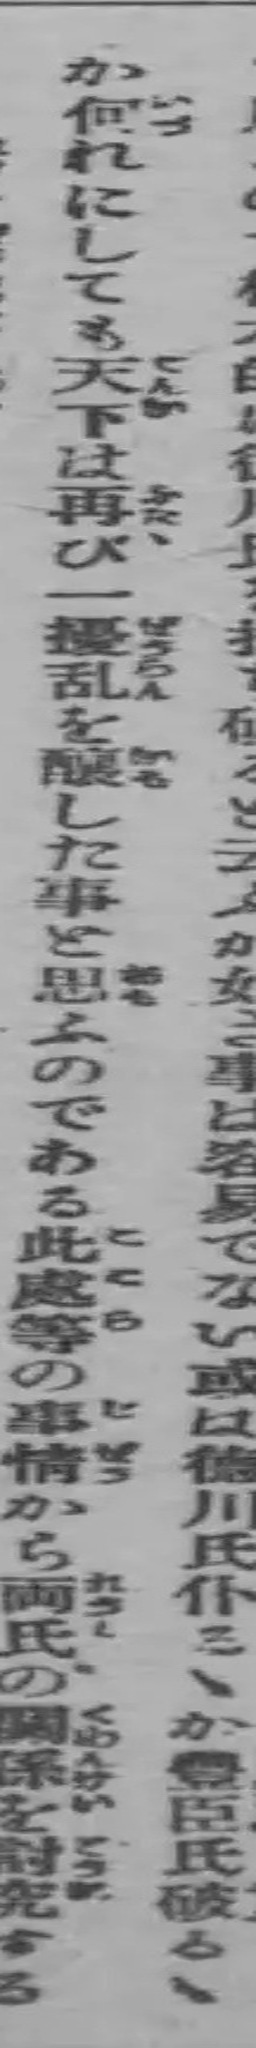か何れにしても天下は再び一擾乱を醸した事と思ふのである此処等の事情から両氏の関係を討究する
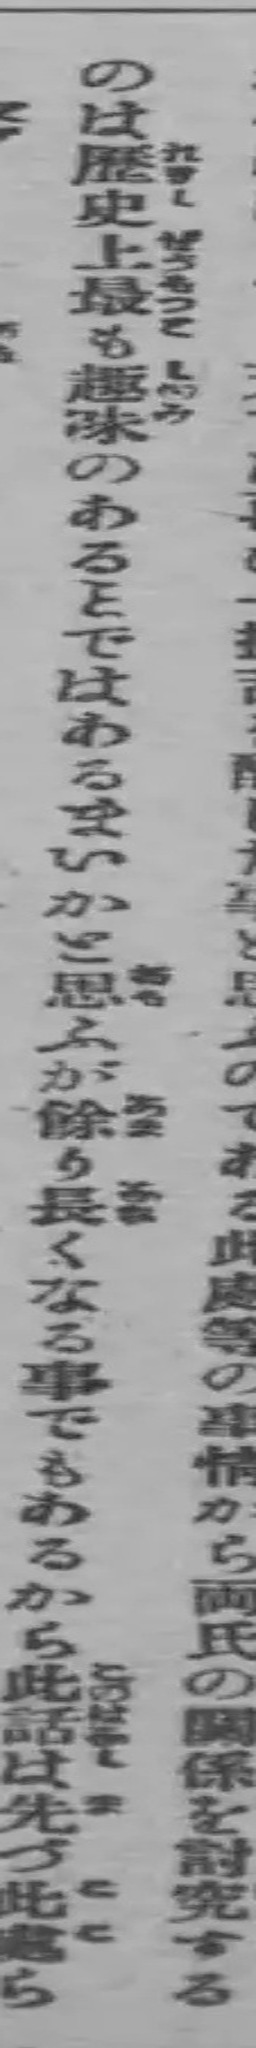のは歴史上最も趣味のあることではあるまいかと思ふが余り長くなる事でもあるから此話は先づ此処ら
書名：豊橋市史談
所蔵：国立国会図書館 National Diet Library, JAPAN
